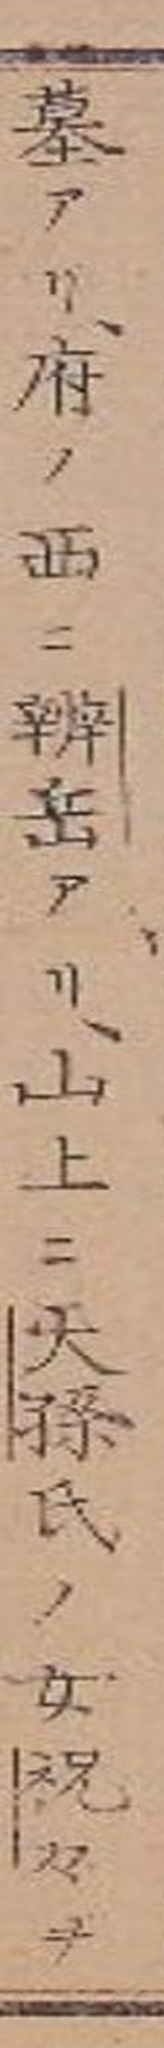墓アリ、府ノ西ニ弁岳アリ、山上ニ天孫氏ノ女祝々ヲ
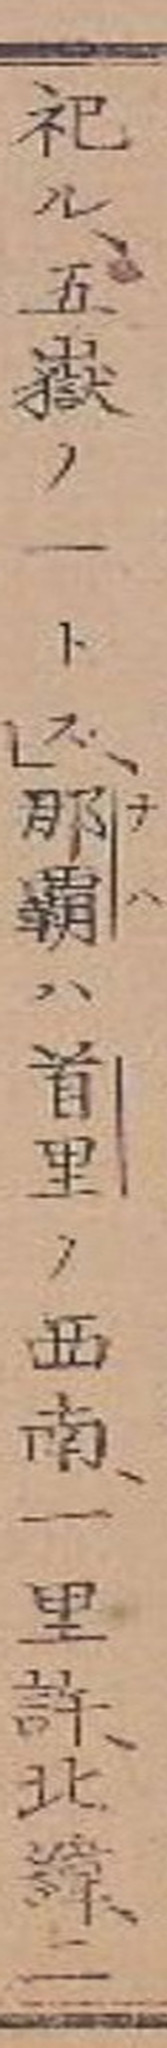祀ル、五岳ノ一トス、」那覇ハ首里ノ西南、一里許、北緯、二
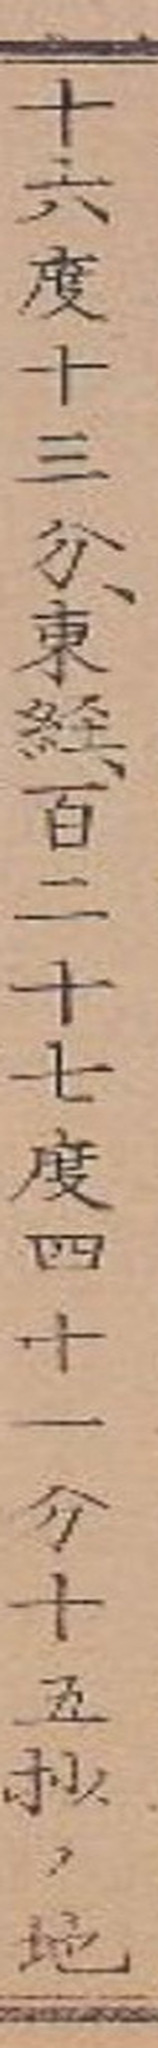十六度十三分、東経、百二十七度四十一分十五秒ノ地
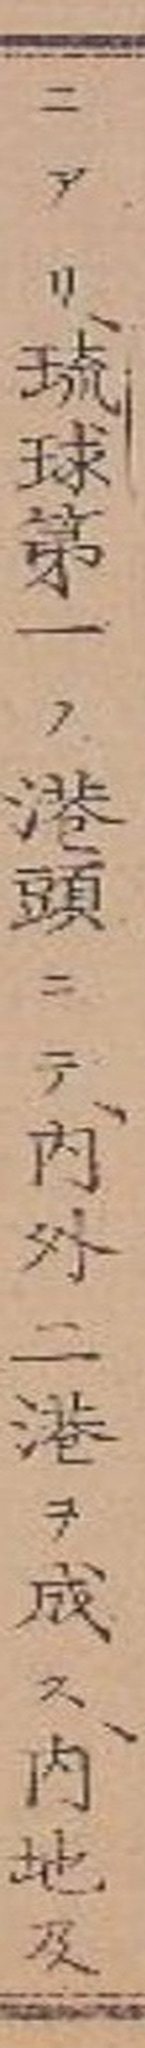ニアリ、琉球第一ノ港頭ニテ、内外二港ヲ成ス、内地及
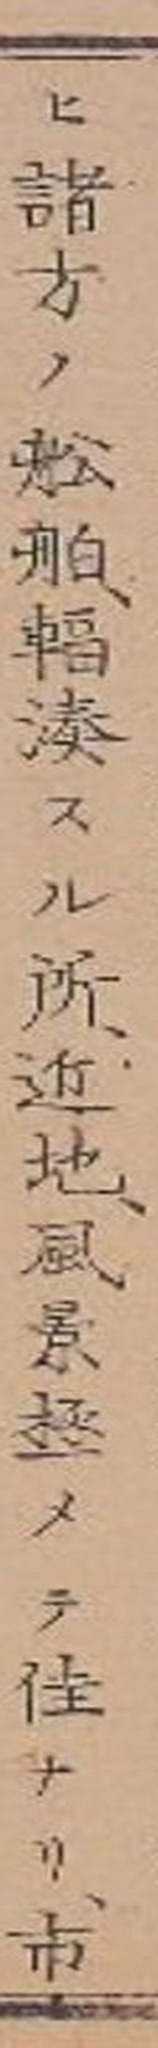ヒ諸方ノ船舶、輻湊スル所、近地、風景極メテ佳ナリ、市
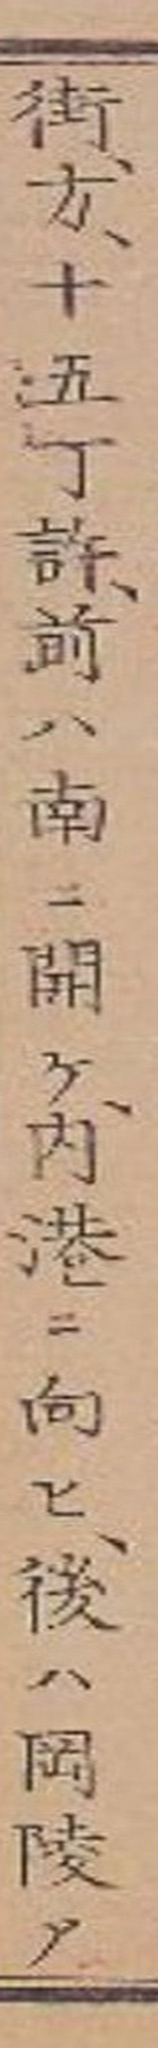街、方、十五丁許、前ハ南ニ開ケ、内港ニ向ヒ、後ハ岡陵ア
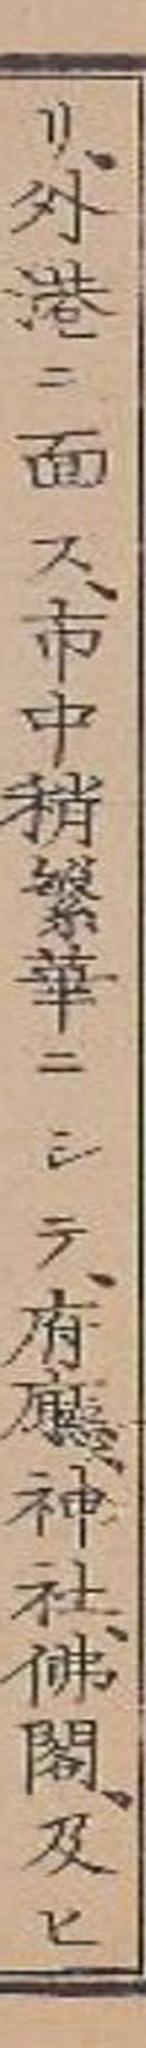リ、外港ニ面ス、市中稍繁華ニシテ、府庁、神社、仏閣、及ヒ
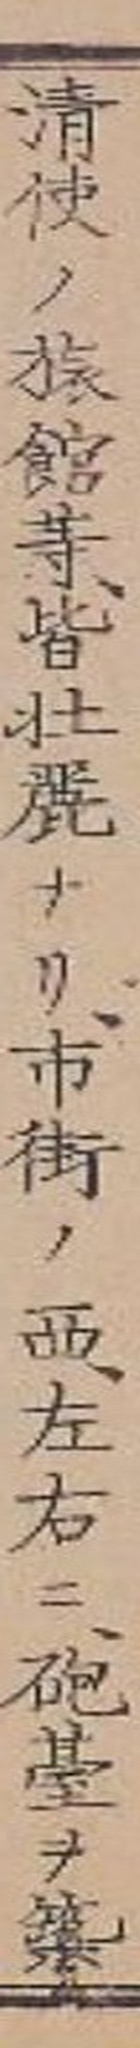清使ノ旅館等、皆壮麗ナリ、市街ノ西、左右ニ、砲台ヲ築
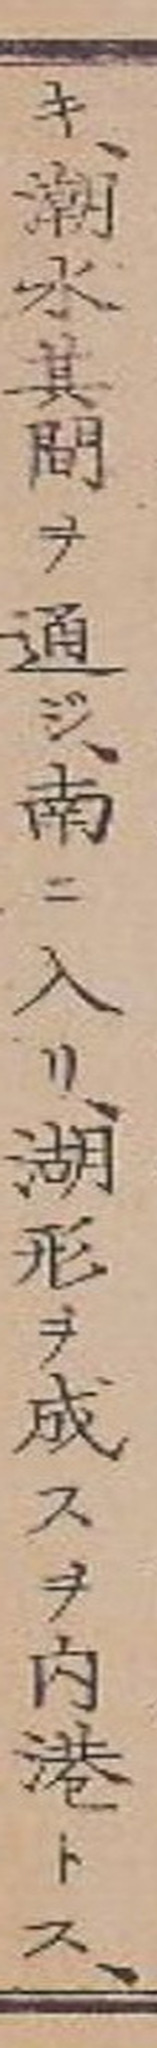キ、潮水其間ヲ通ジ、南ニ入リ、湖形ヲ成スヲ内港トス、
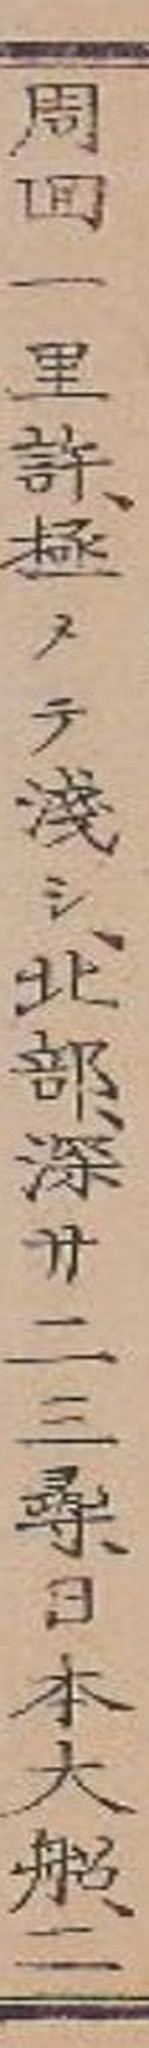周回一里許、極メテ浅シ、北部、深サ二三尋、日本大船、二
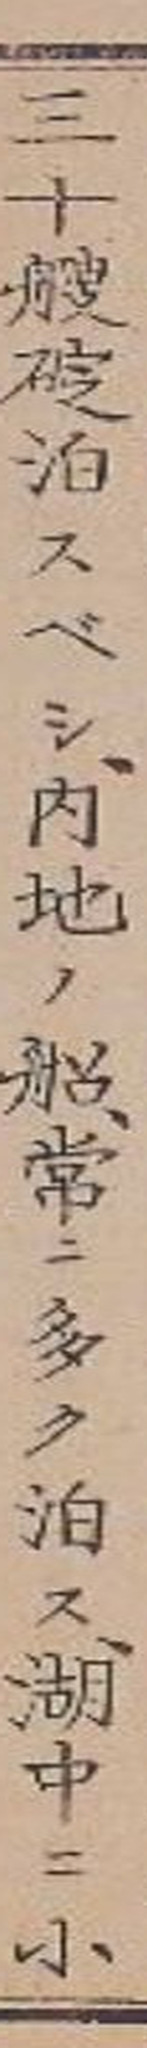三十艘碇泊スベシ、内地ノ船、常ニ多ク泊ス、湖中ニ小
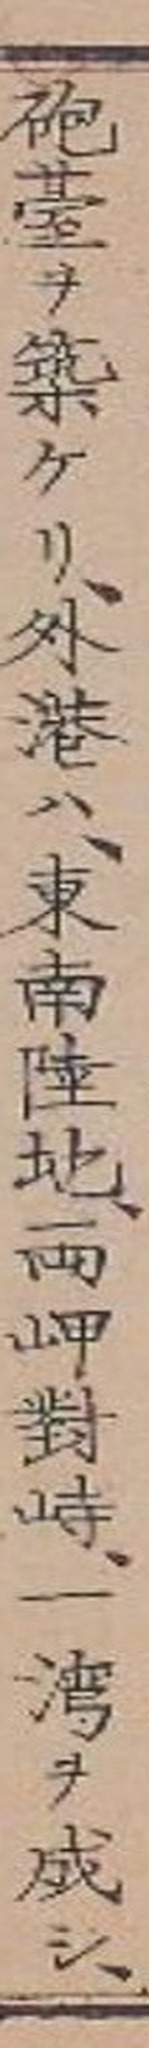砲台ヲ築ケリ、外港ハ、東南陸地、両岬対峙、一湾ヲ成シ、
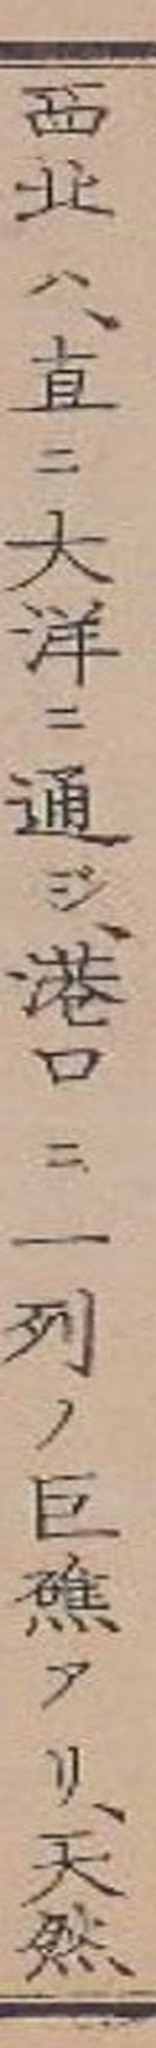西北ハ、直ニ大洋ニ通ジ、港口ニ一列ノ巨礁アリ、天然
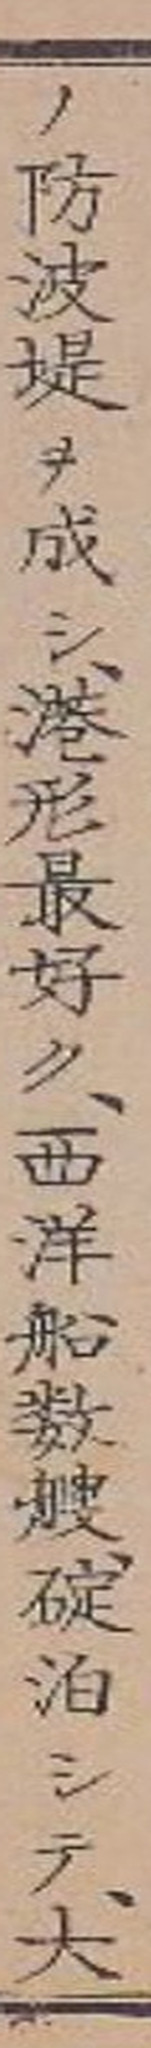ノ防波堤ヲ成シ、港形最好ク、西洋船数艘、碇泊シテ、大
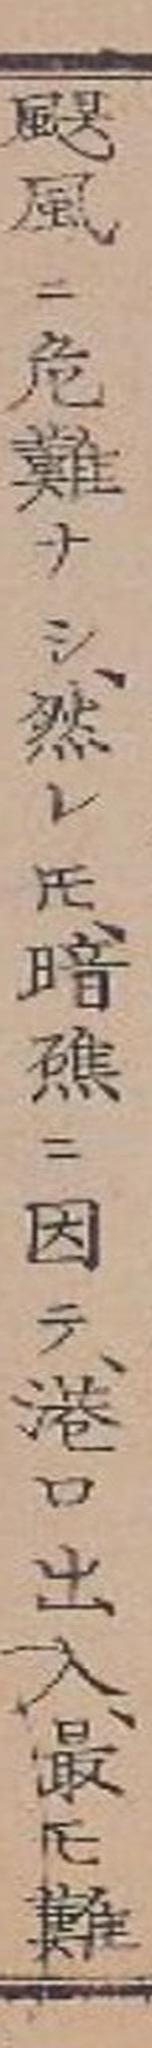颶風ニ危難ナシ、然レトモ、暗礁ニ因テ、港口出入、最モ難
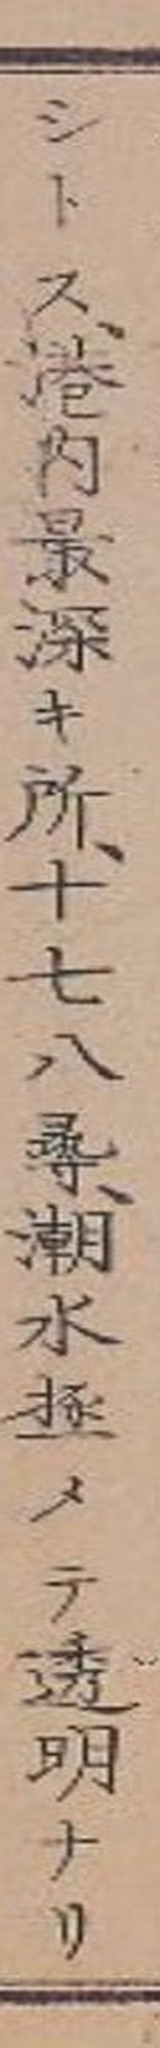シトス、港内最深キ所、十七八尋、潮水極メテ透明ナリ
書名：琉球新誌 巻上
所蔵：University of the Ryukyus Library
